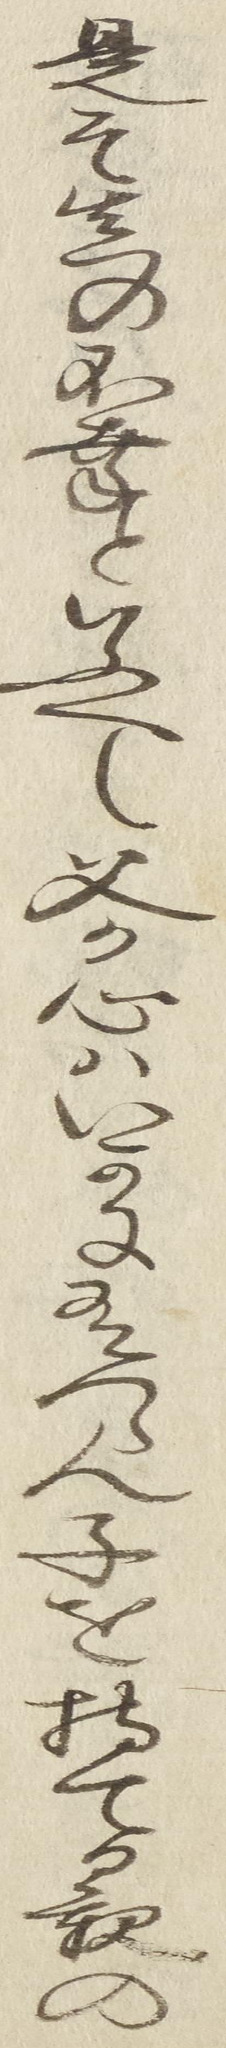是そ真の不幸といふへし父の心はいかに有つらん子を持てる親の
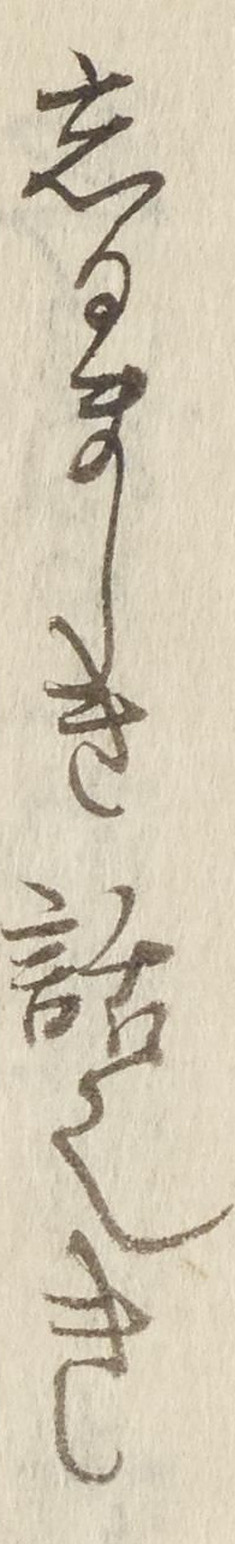忘るましき話也き
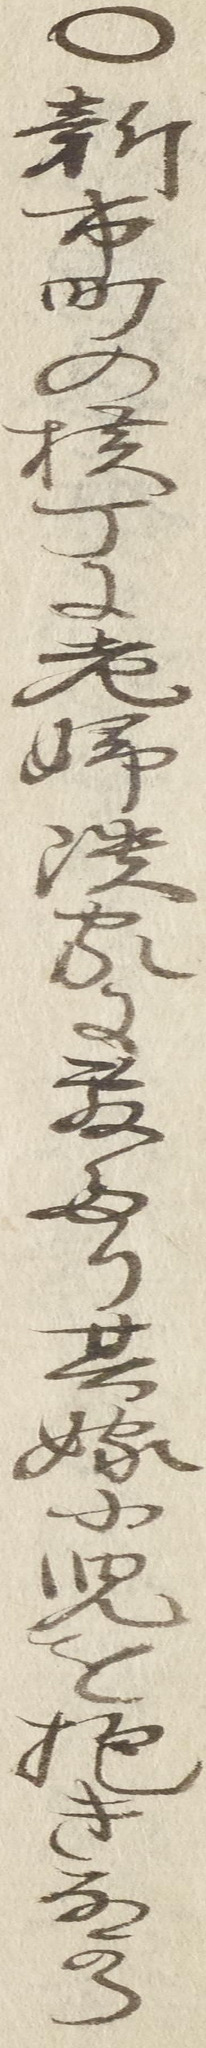〇新市町の横丁に老婦潰家に敷たり其嫁小児を抱きなから
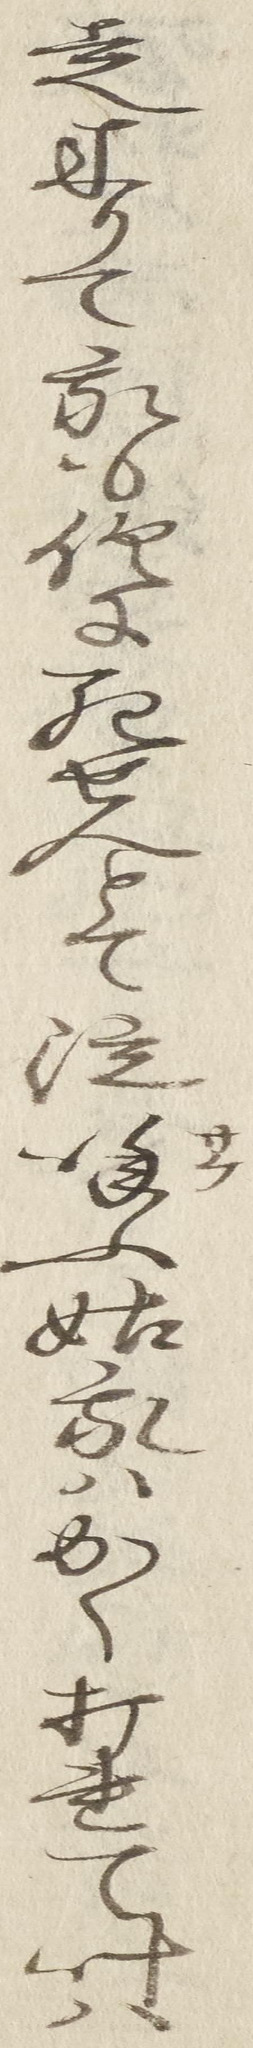走来りて我も侭に死せんとて泣叫ふ姑我はかく打れて叶は
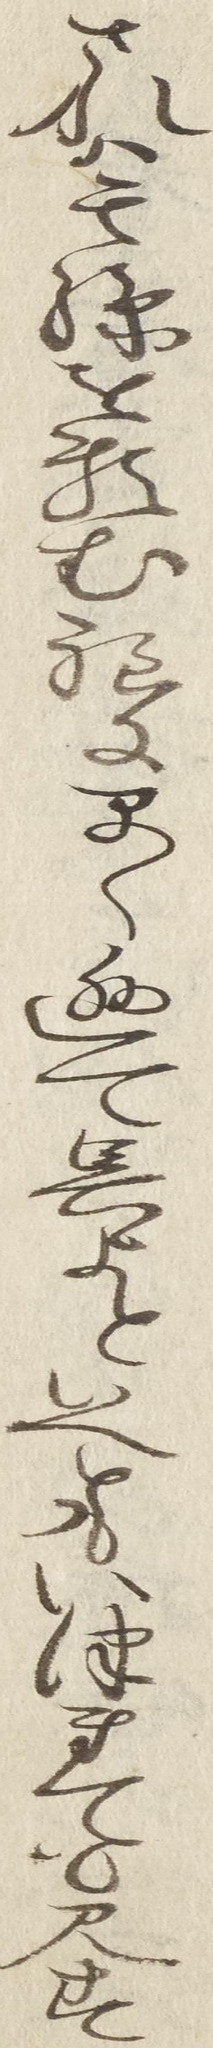されは其孫を頼む程に早々迎て呉よといへともいつまても見す
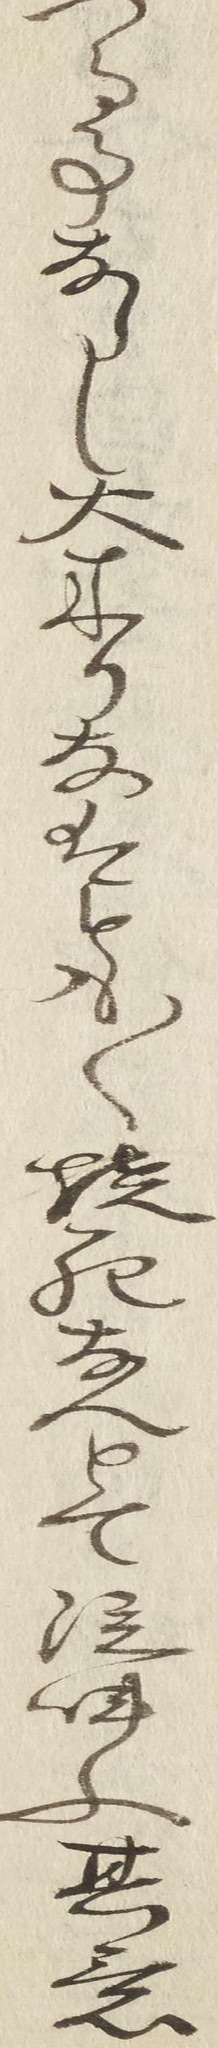つる事なし火来りなはとかく焼死なんとて泣叫ふ其意
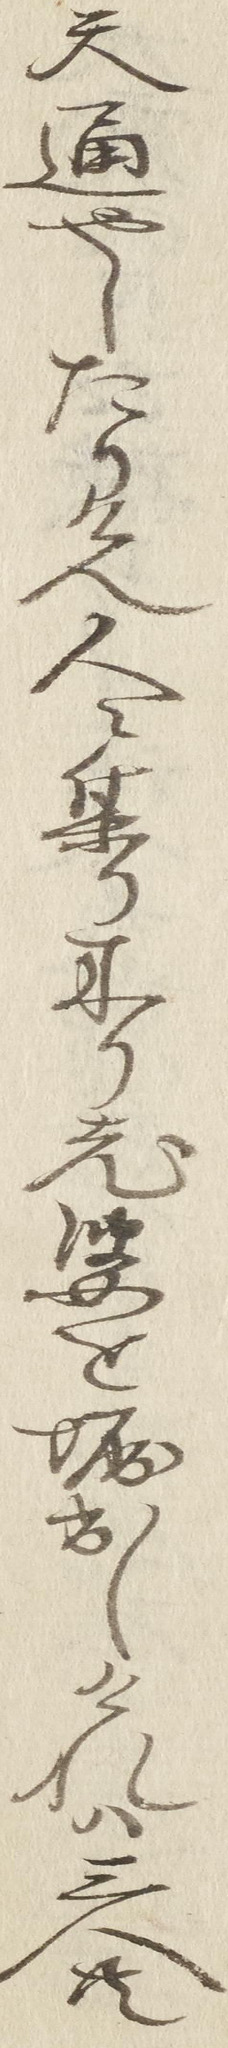天通やしたりけん人々集り来り老婆を掘出しけれは三人共
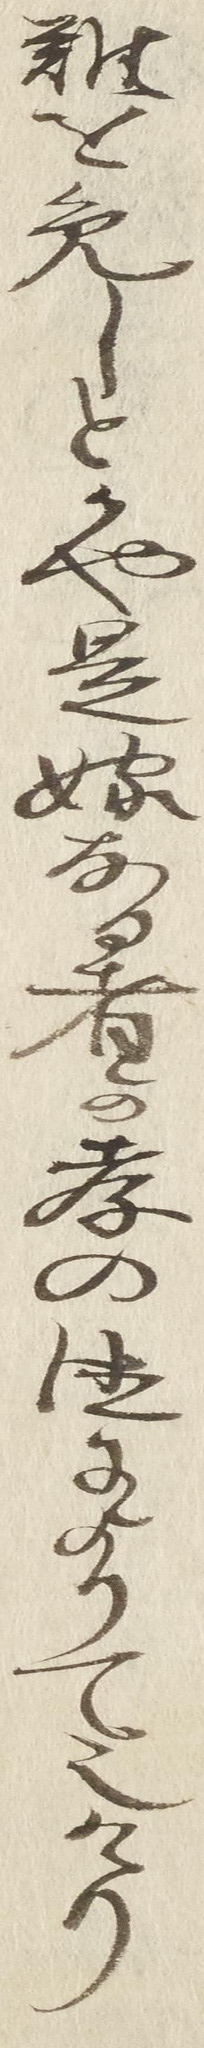難を免しとかや是嫁なる者の孝の徳によりて也けり
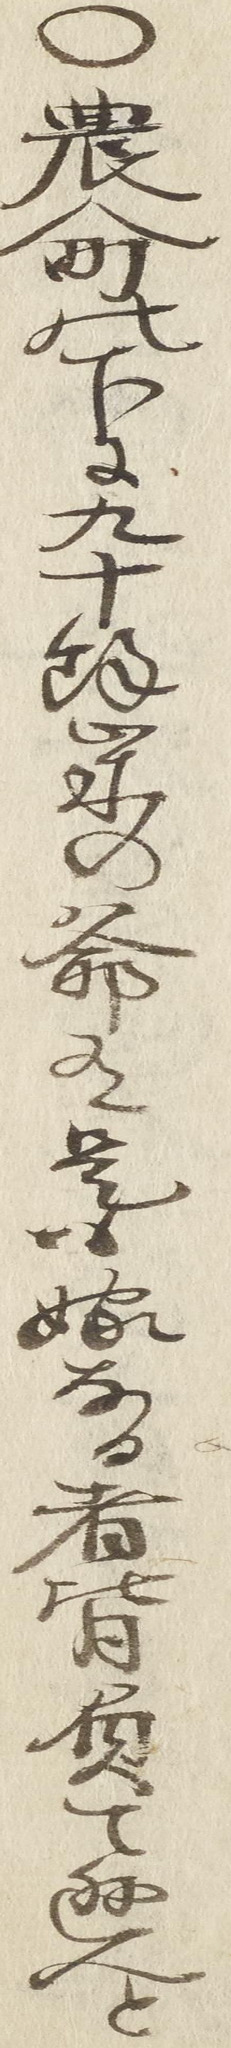〇農人町の下に九十余歳の爺有是も嫁なる者背負て遁んと
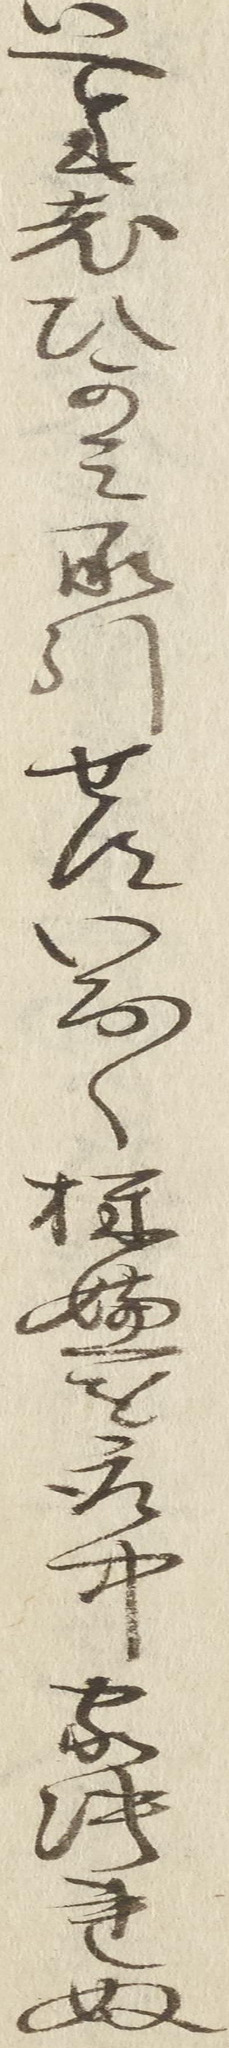いへとも老ひかみ承引せす色々機嫌を取中家潰れぬ
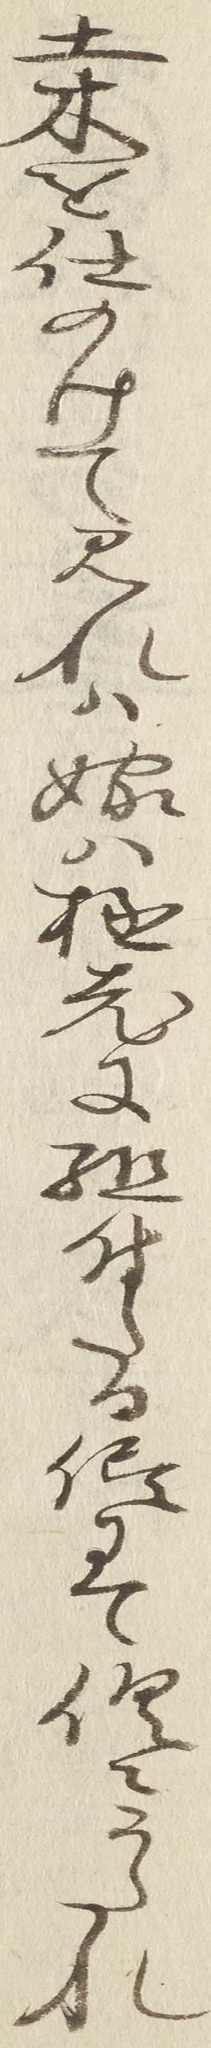土木を仕のけて見れは嫁は拙老に組付たる侭にて俱にうたれ
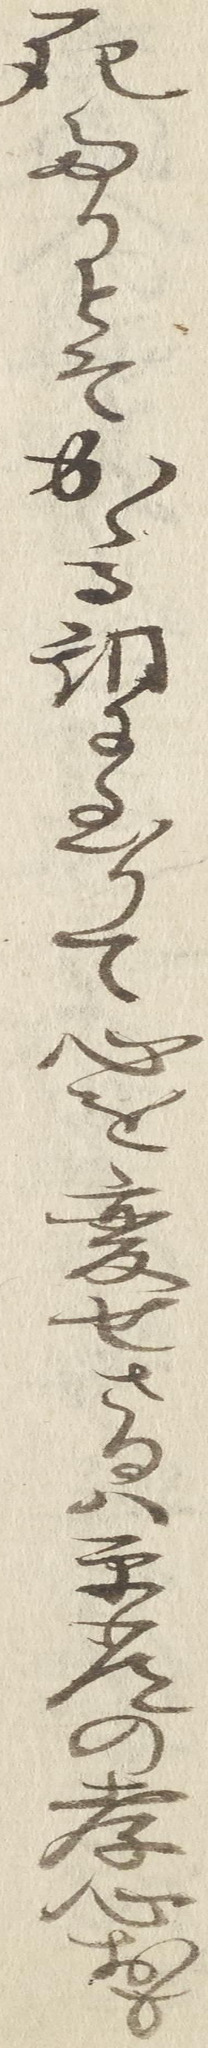死たりとそかゝる期に至りて心を変せさるは平常の孝心おも
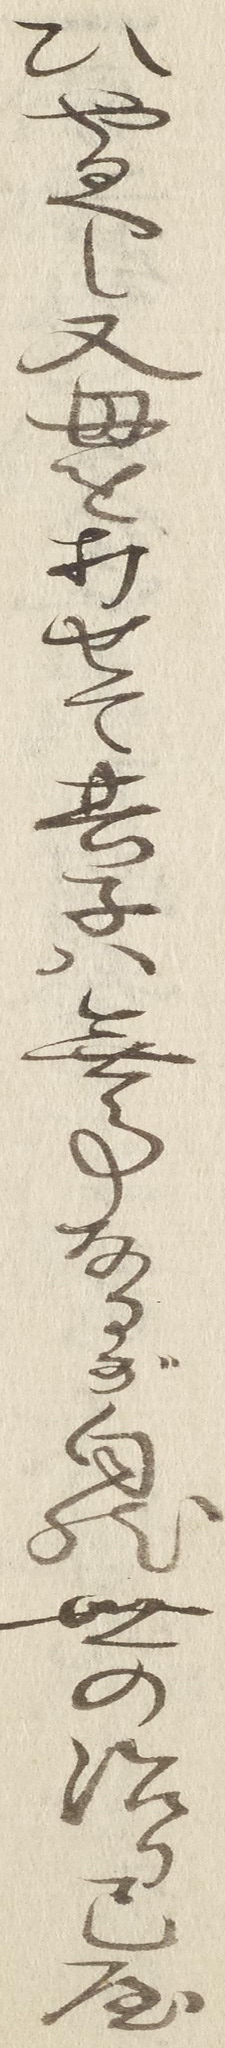ひやるへし又母を打せて其子は無事なるが自然世の治り己屋
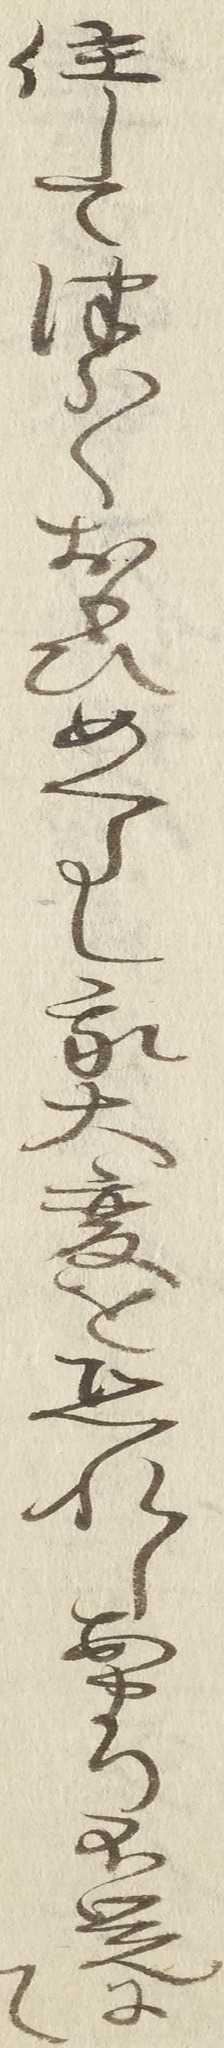住してつらくおもひめくらし我大変と恐れしあまり不覚にて
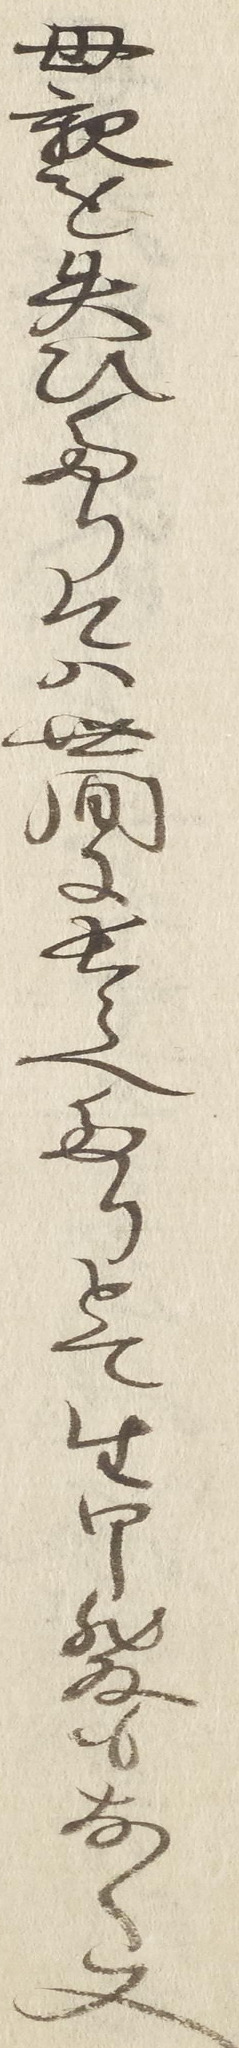母親を失ひたり今は世間に長らへたりとて生甲斐もなく又
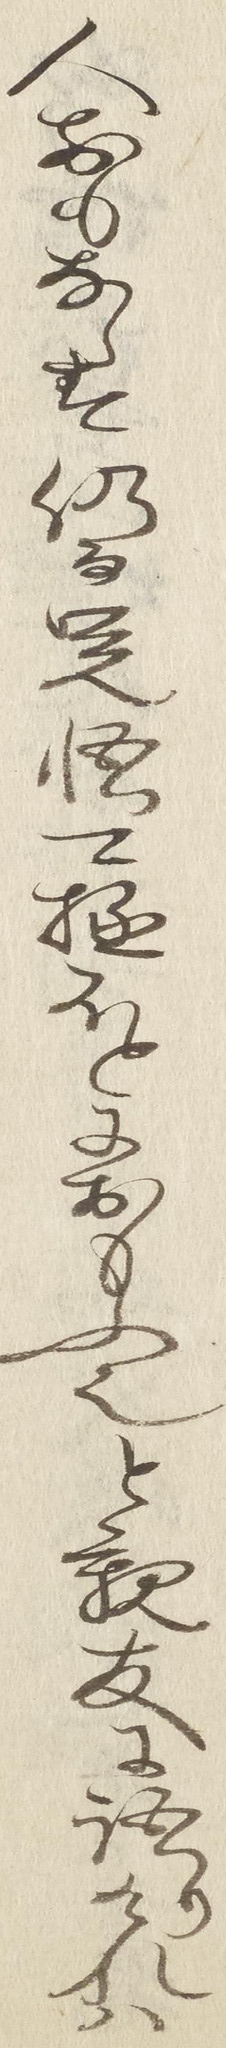人前もならす仍而覚悟可極ほとにゆもふ也と親友に語りけれは
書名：地震記　上
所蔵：東京大学地震研究所図書室 Earthquake Research Institute Library, The University of Tokyo, JAPAN
